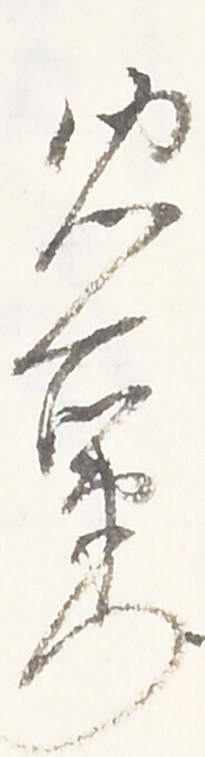忠右衛門
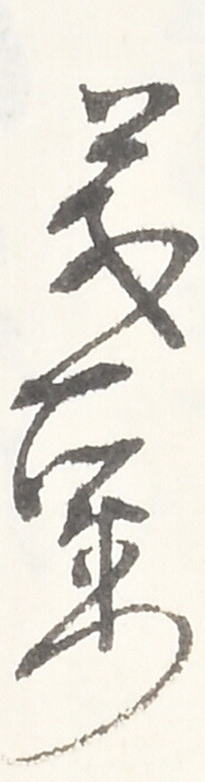義右衛門
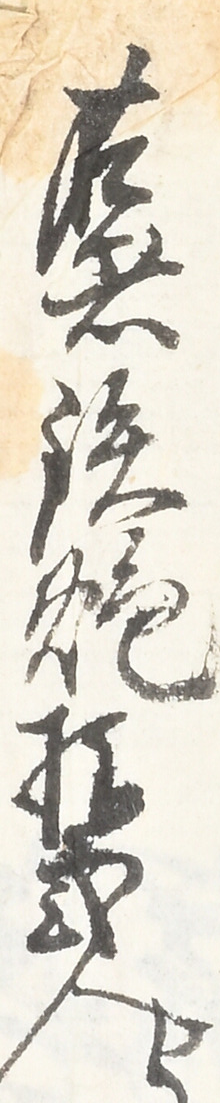右者鉄炮拾弐人
